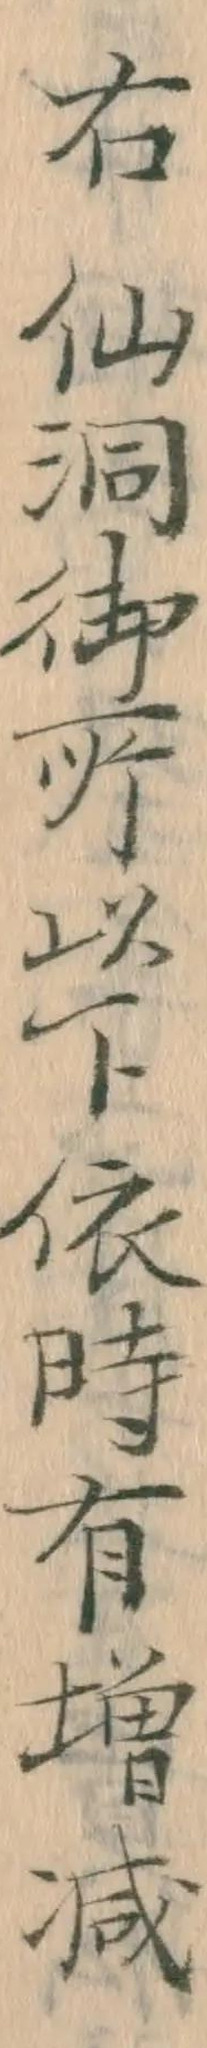右仙洞御所以下依時有増減
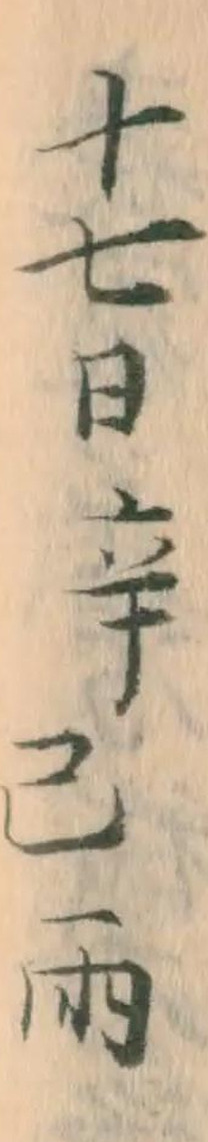十七日辛巳雨
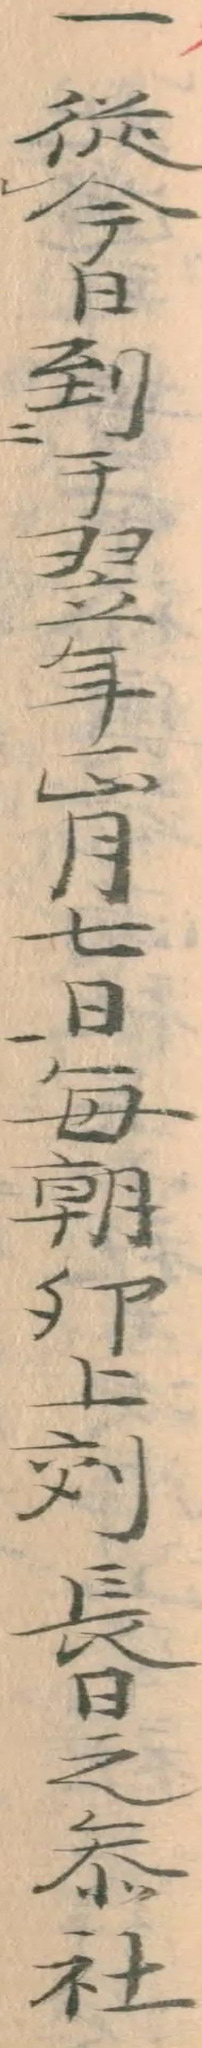一従今日到于翌年正月七日毎朝卯上刻長日之参社
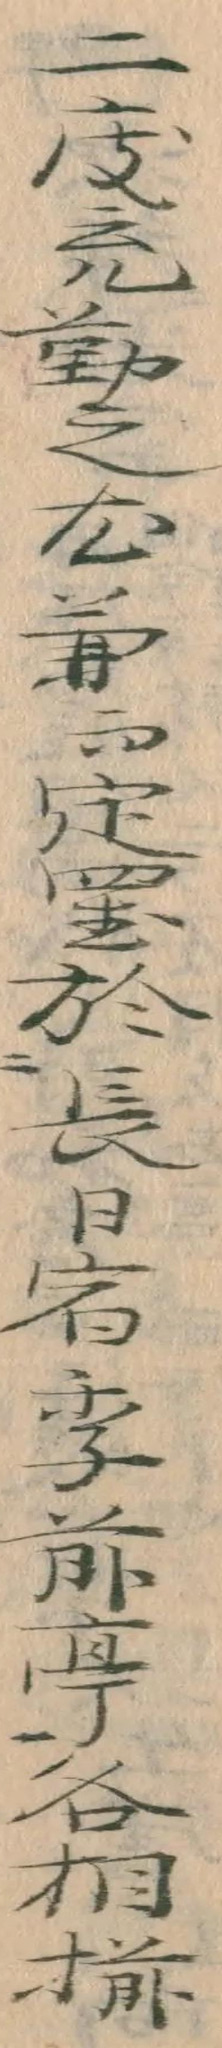二度充勤之公兼而定置於長日宿季前亭各相揃
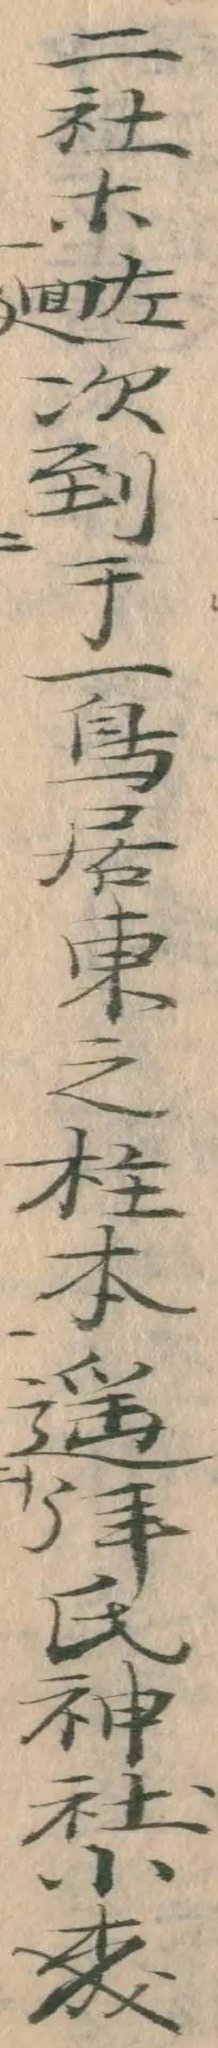二社等左廻次到于一鳥居東之柱本遥拝氏神社小森
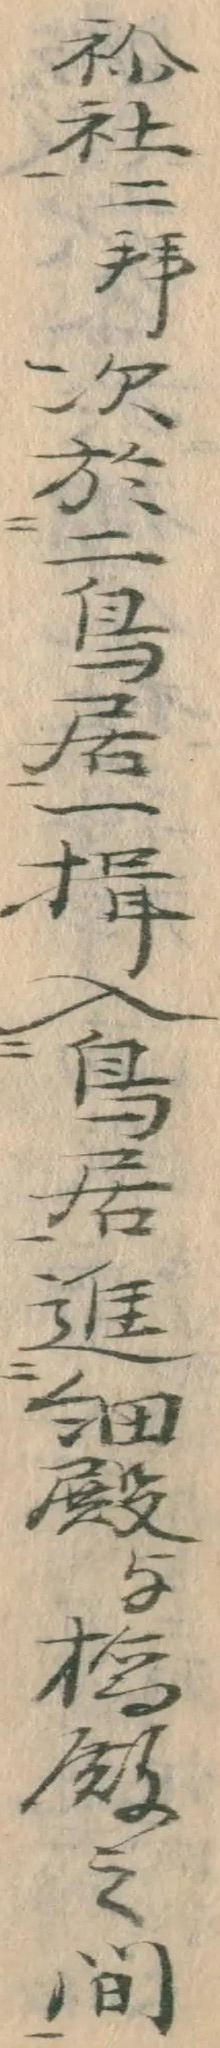祢社ニ拝次於二鳥居一楫入鳥居進細殿与橋殿之間
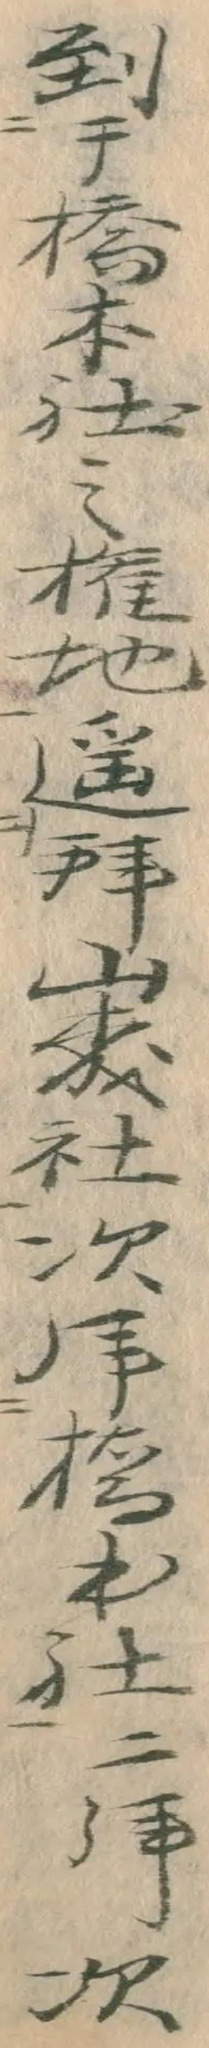到于橋本社之権地遥拝山森社次拝橋本仕二拝次
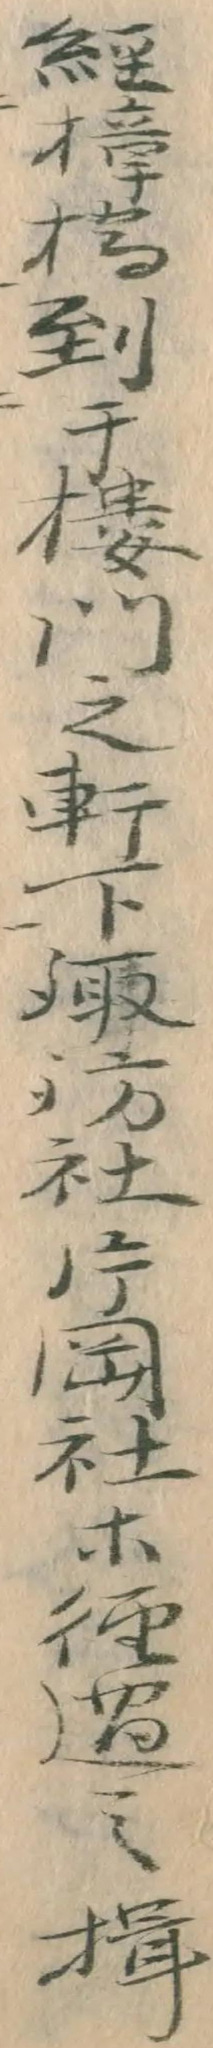経樟橋到于楼門之軒下諏訪社片岡社等経過之揖

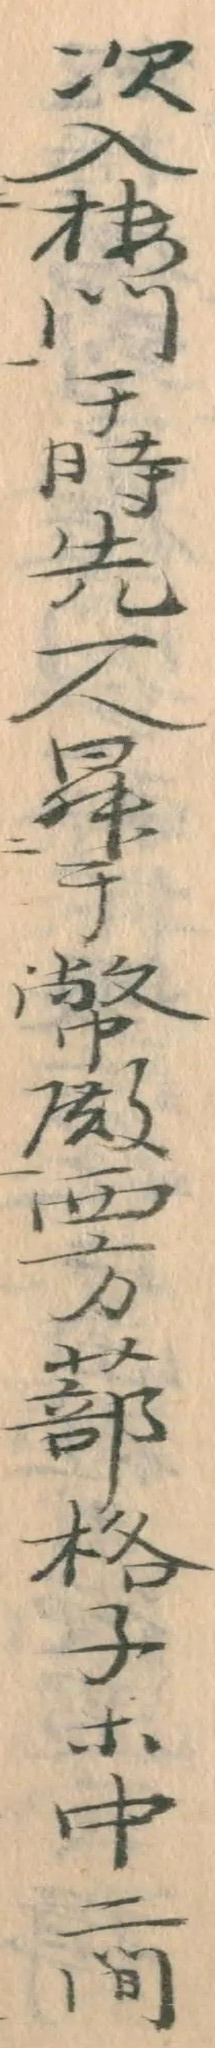次入楼門于時先一人昇于幣殿西方蔀格子等中二間
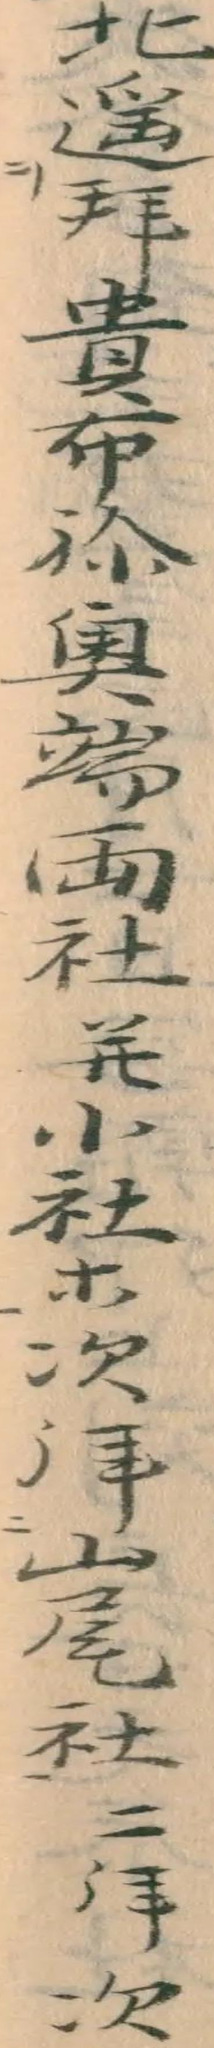北遥拝貴布祢奥端両社并小社等次拝山尾社二拝次
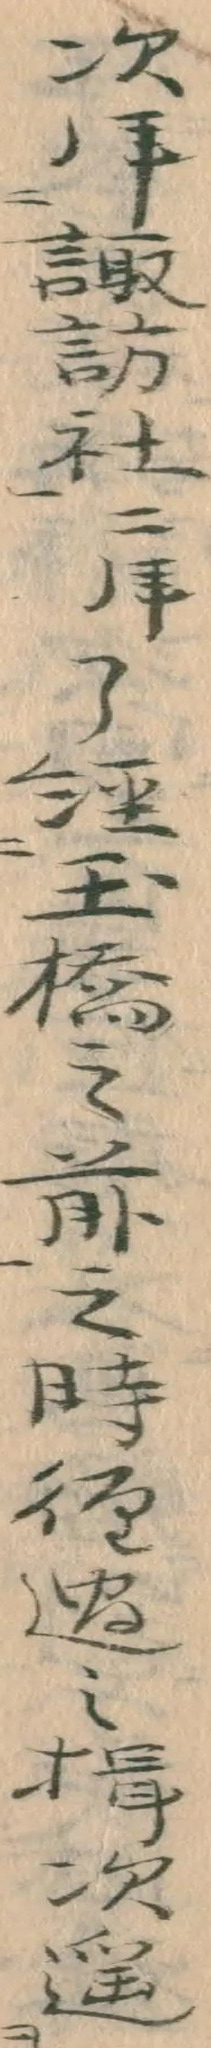次拝諏訪社ニ拝了経玉橋之前之時経過之揖次遥
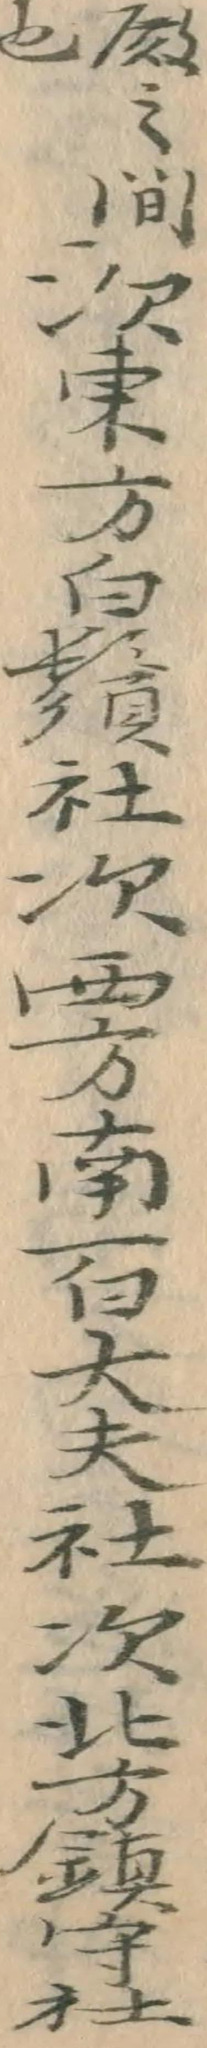殿之間也次東方白髭社次西方南百大夫社次北方鎮守社

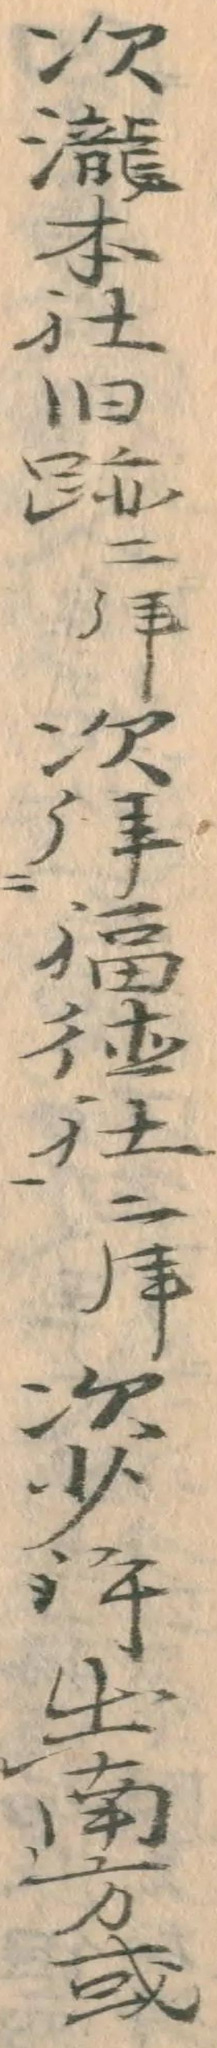次瀧本社旧跡二拝次拝福徳社二拝二行目次少許出南方或
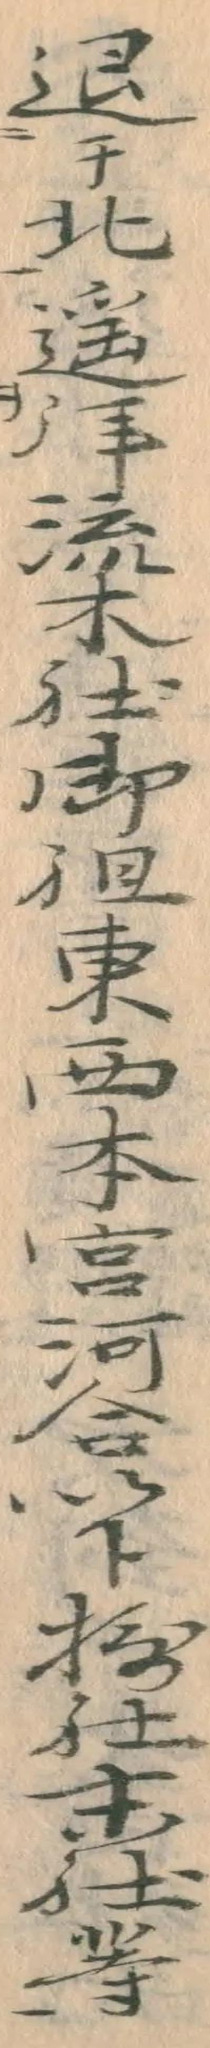退于北遥拝流木社御祖東西本宮河合以下摂社末社等
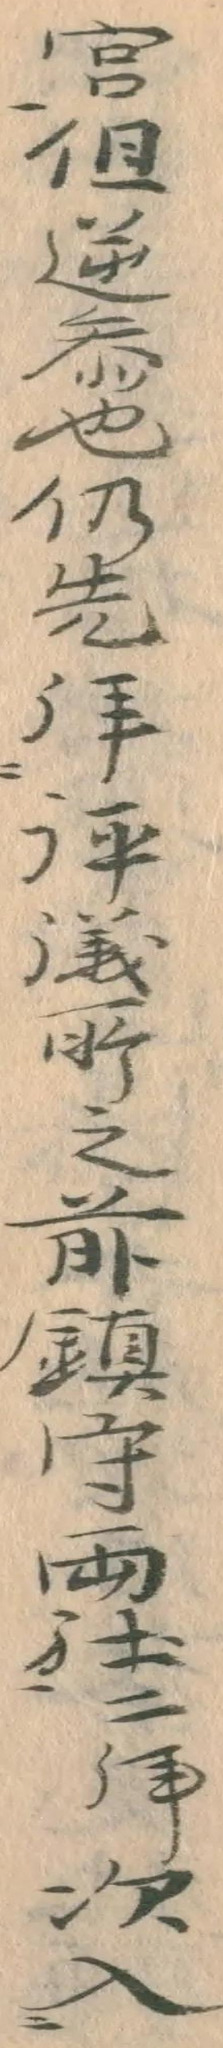宮但逆参也仍先拝評議所之前鎮守両社二拝次入
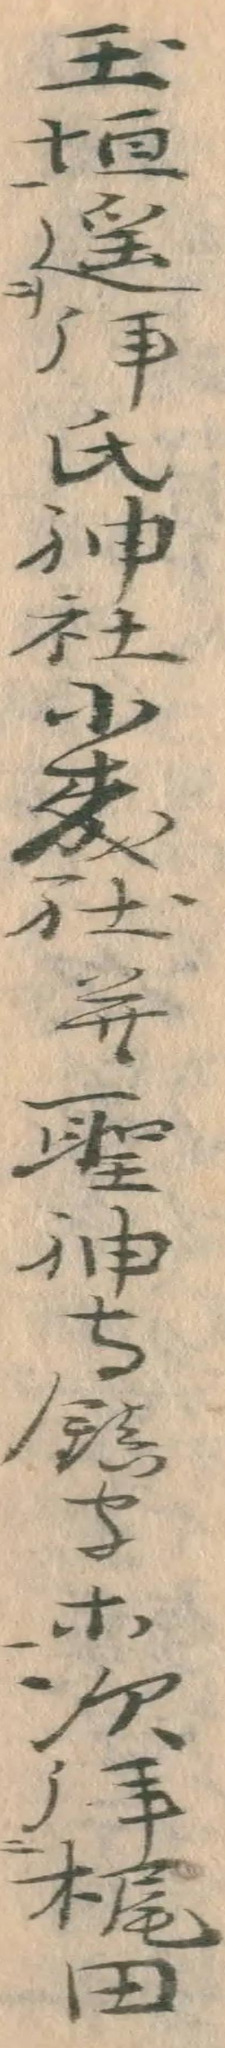玉垣遥拝氏神社小森社并聖神寺鎮守等須拝梶田
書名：賀茂社記録. 第72冊
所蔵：国立国会図書館 National Diet Library, JAPAN
